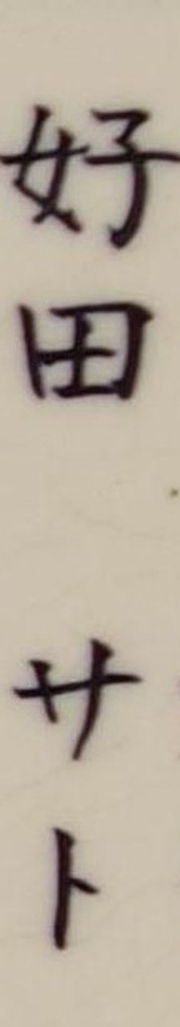好田サト
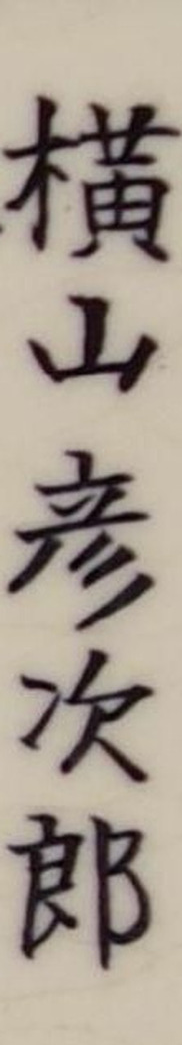横山彦次郎
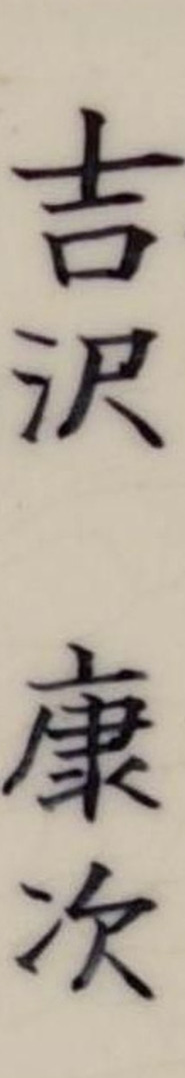吉沢康次
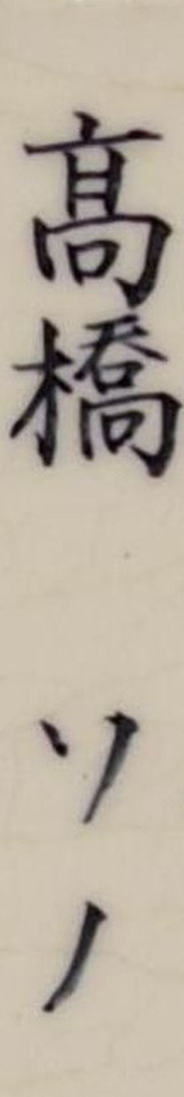高橋ソノ
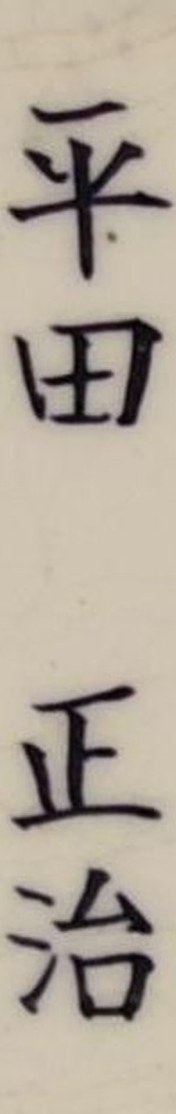平田正治
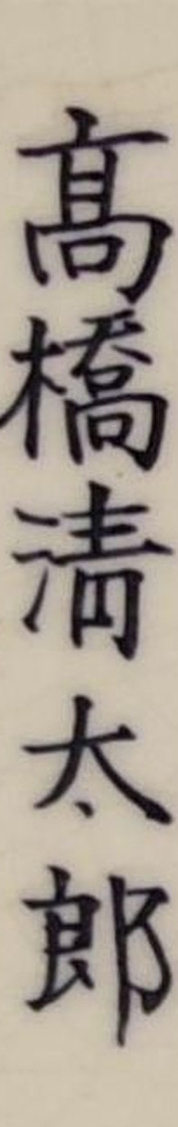高橋清太郎
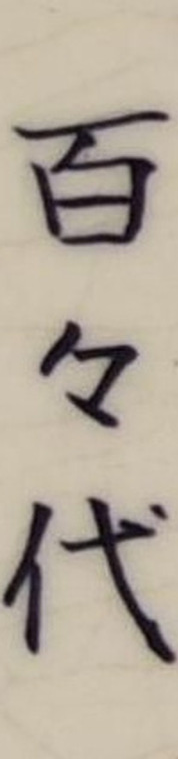百々代
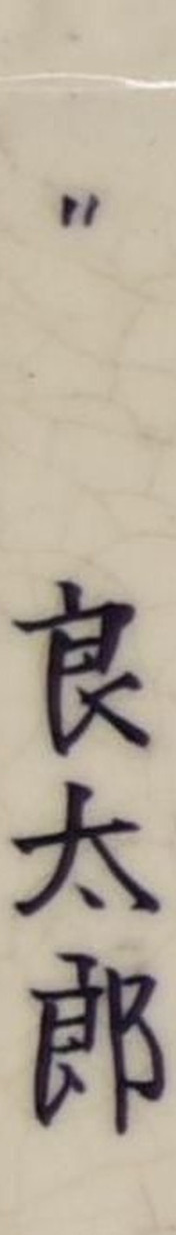良太郎
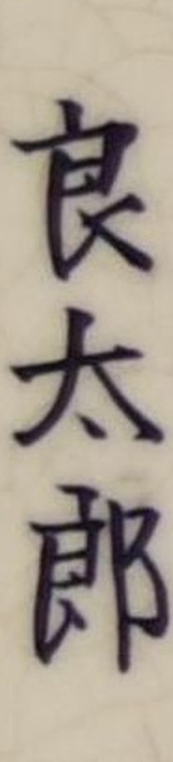良太郎

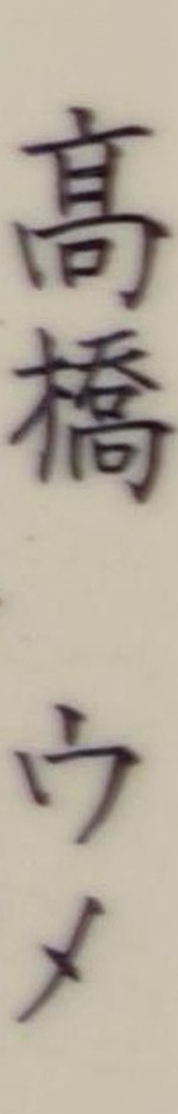高橋ウメ
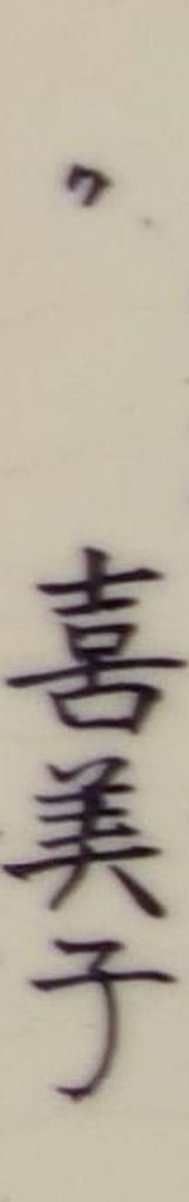喜美子
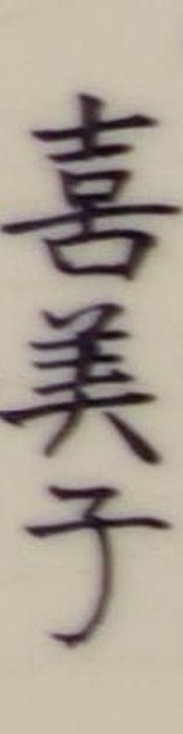喜美子
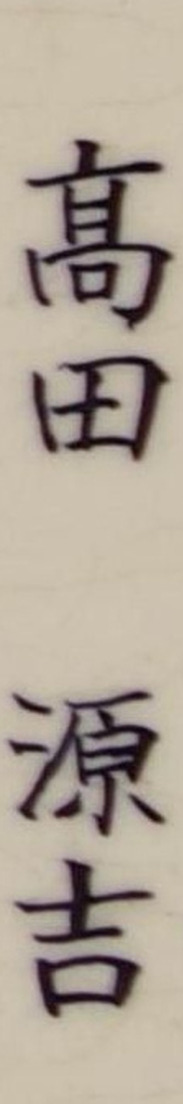高田源吉
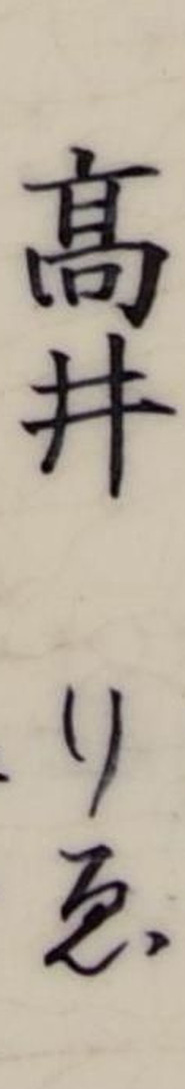高井りえ
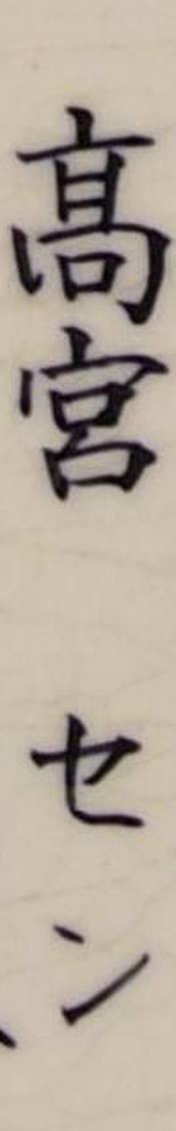高宮セン
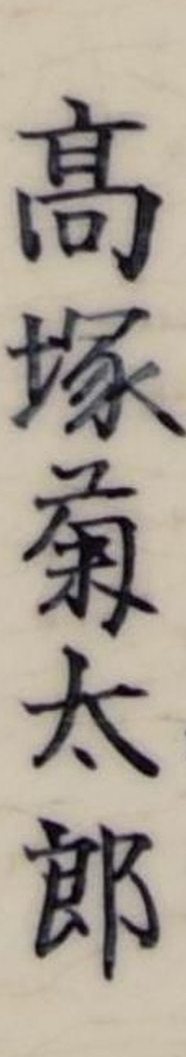高塚菊太郎
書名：E~L
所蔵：高野山金剛峯寺
